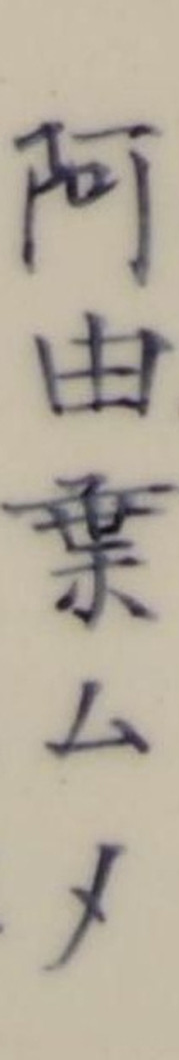阿由葉ムメ
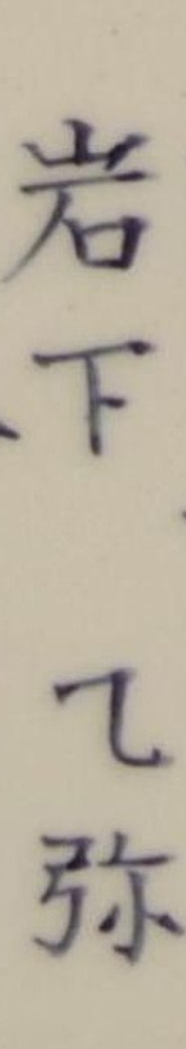岩下乙弥
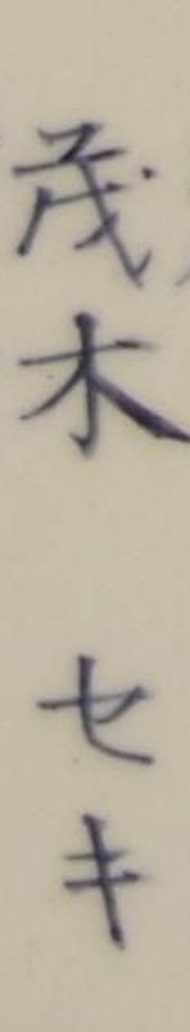茂木セキ
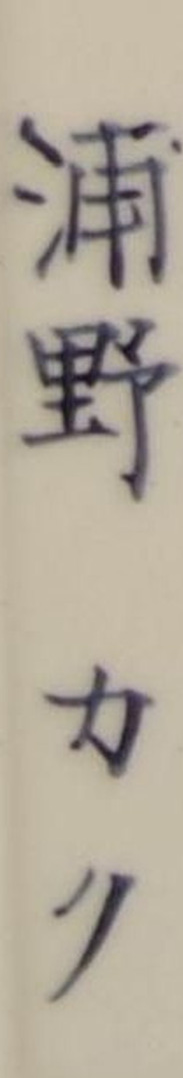浦野カク

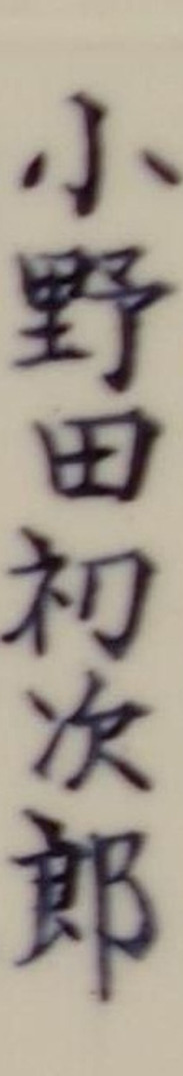小野田初次郎
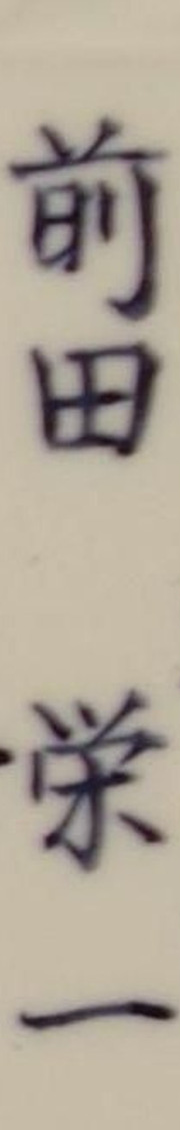前田栄一
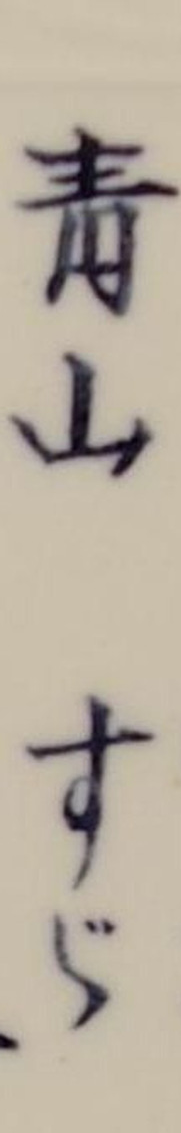青山すゞ
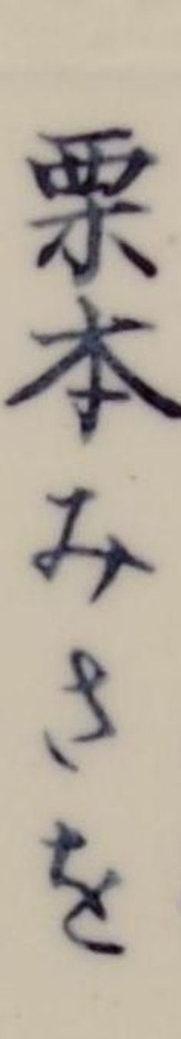栗本みさを
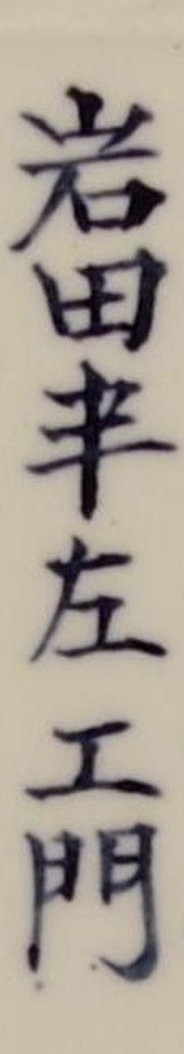岩田半左エ門
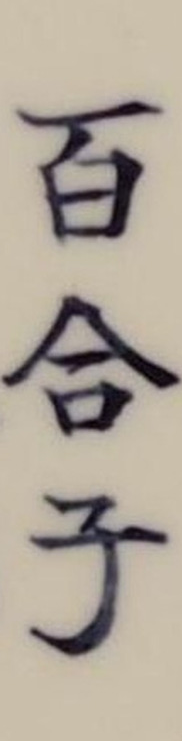百合子
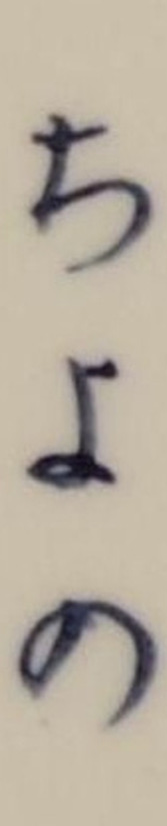ちよの
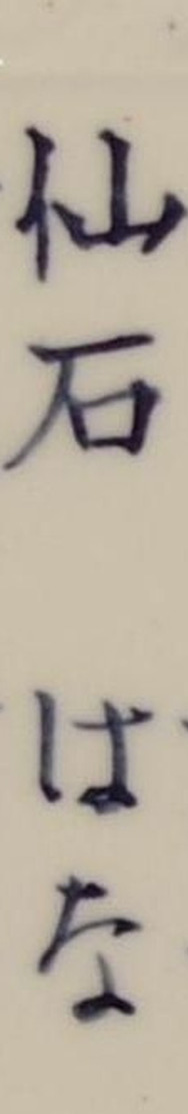仙石はな
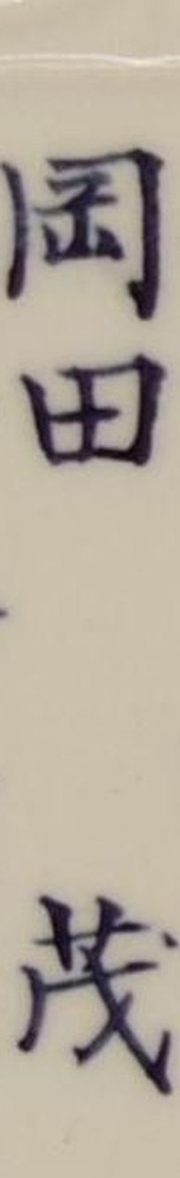岡田茂
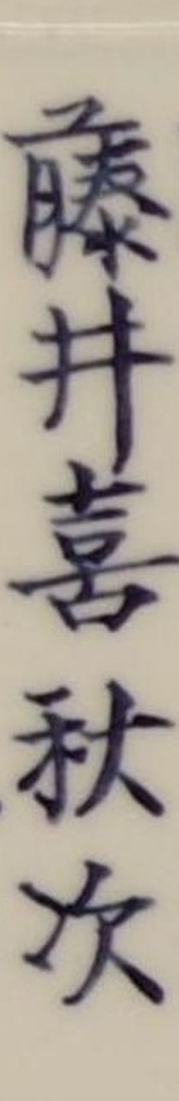藤井喜秋次
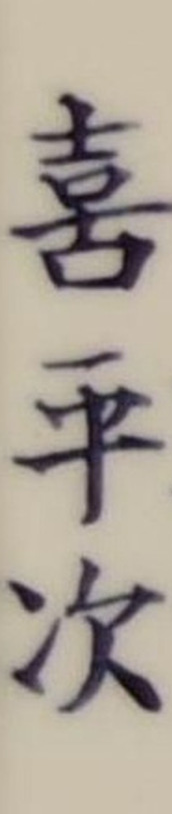喜平次

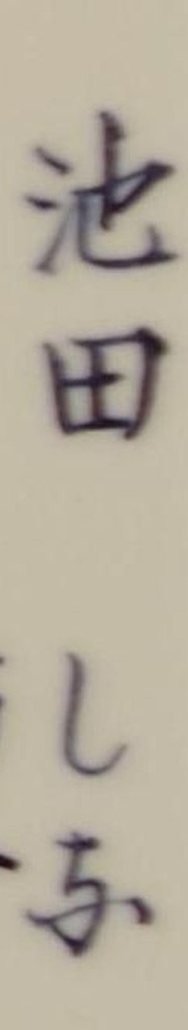池田しな
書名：M~S
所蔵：高野山金剛峯寺
